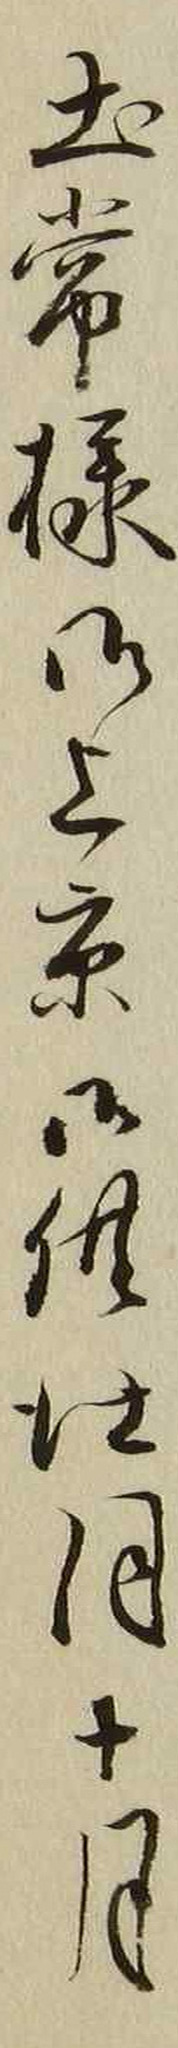土常様御上京御供仕同十月
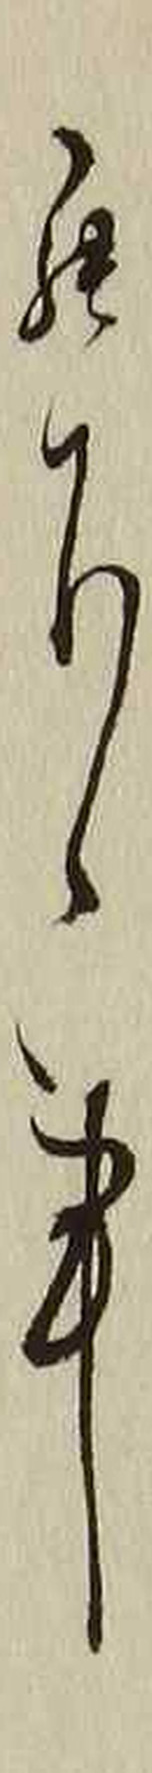罷下候事
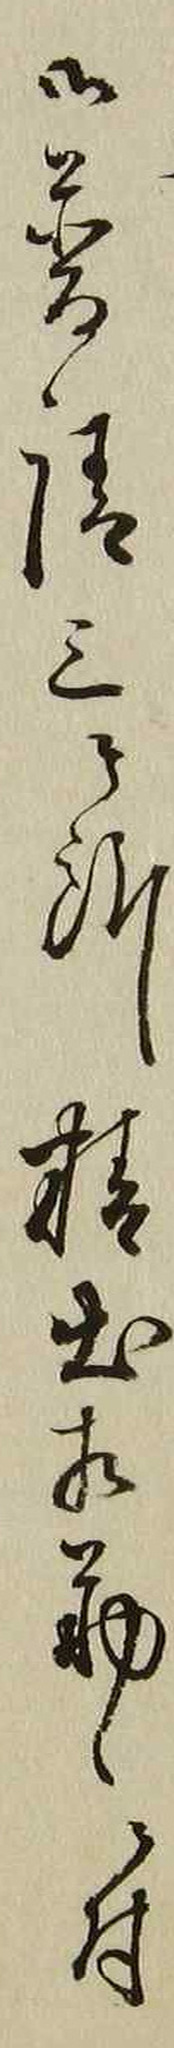御普請三ケ所精出相勤候ニ付
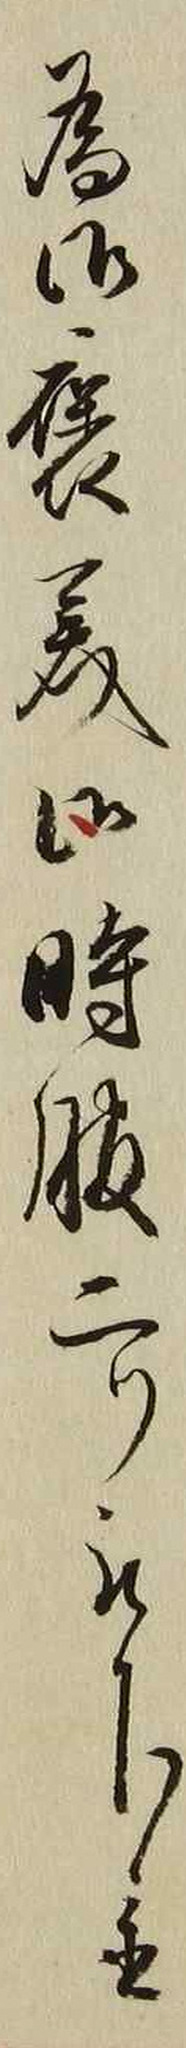為御褒美御時服二ツ被下置
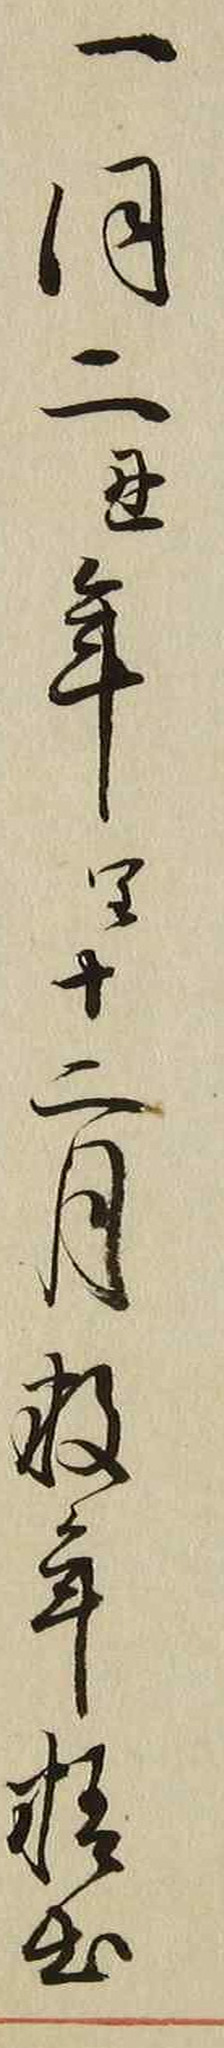一同二丑年閏十二月数年精出
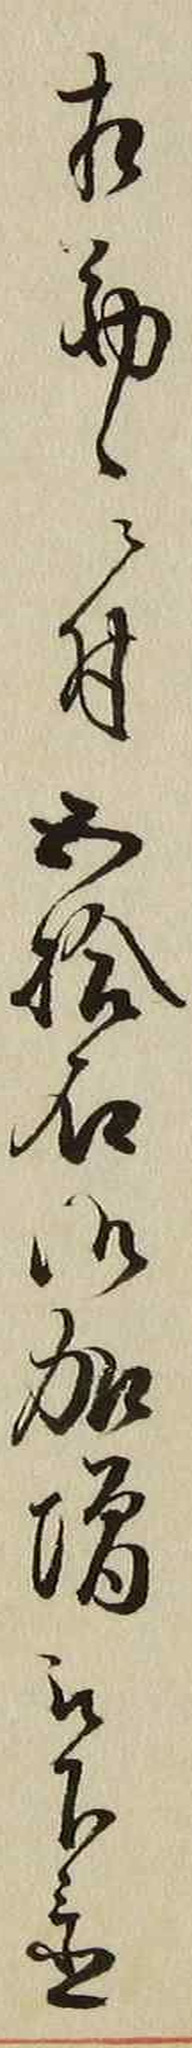相勤候ニ付五拾石御加増被下置
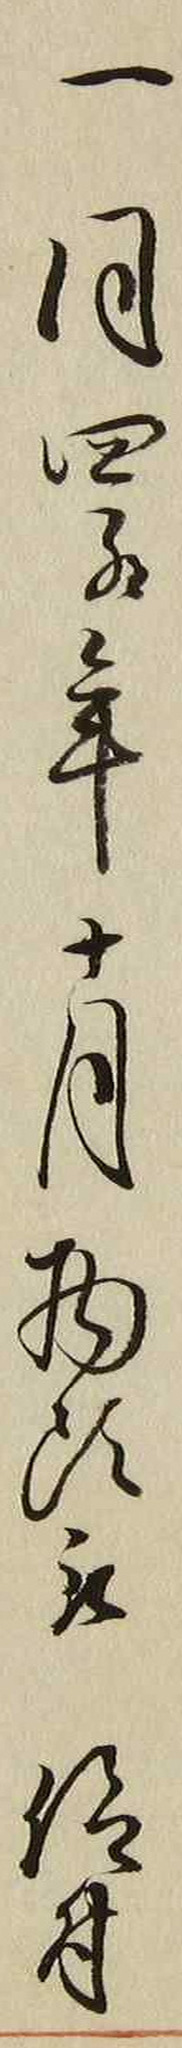一同四卯年十月物頭被仰付
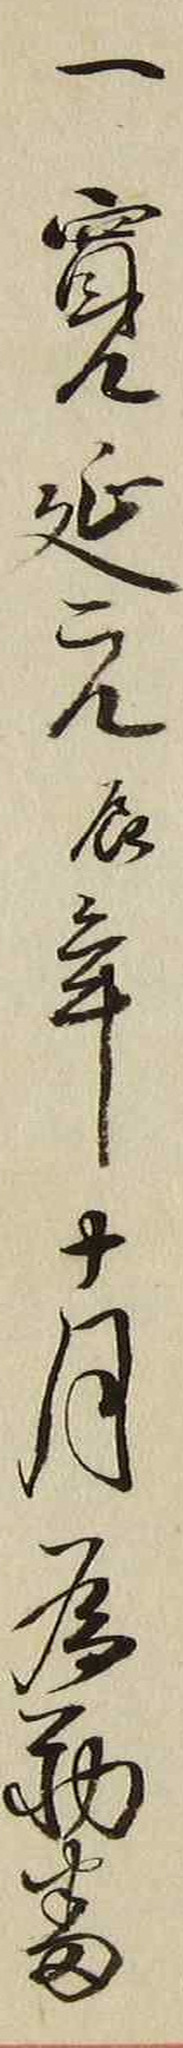一寛延元辰年十月為勤番
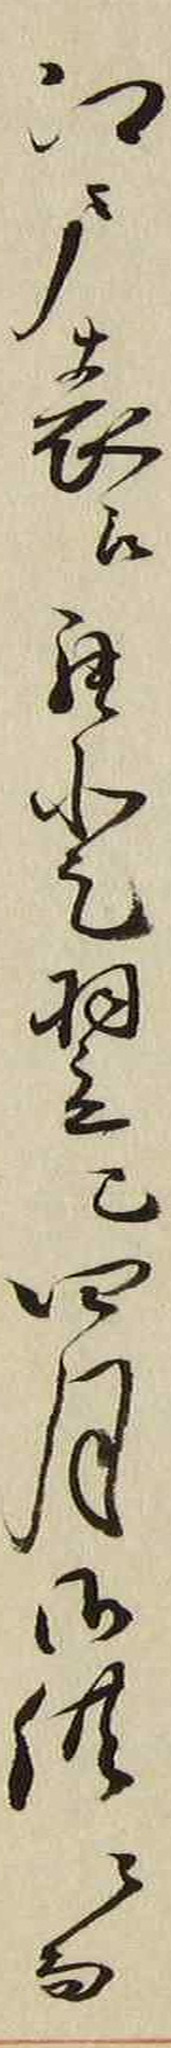江戸表江罷登翌巳四月御供ニ而
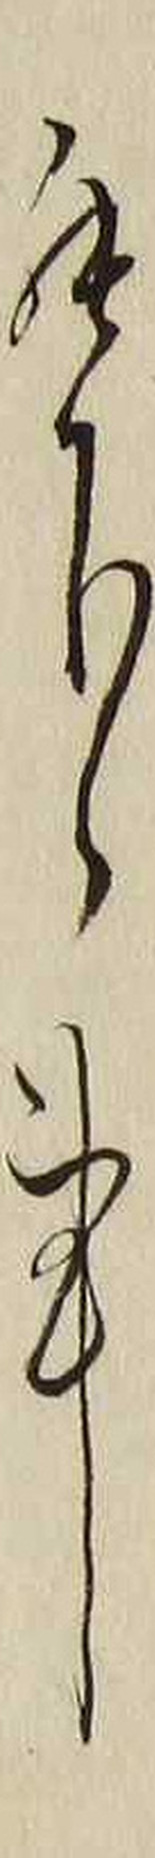罷下候事
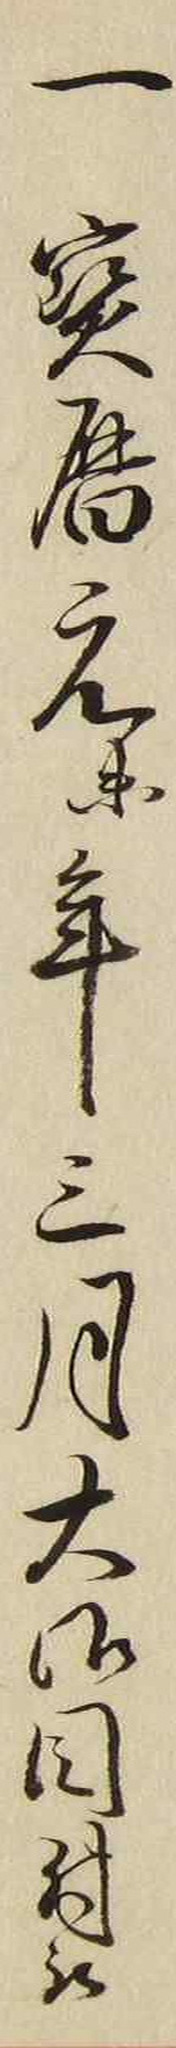一宝暦元未年三月大御目付被

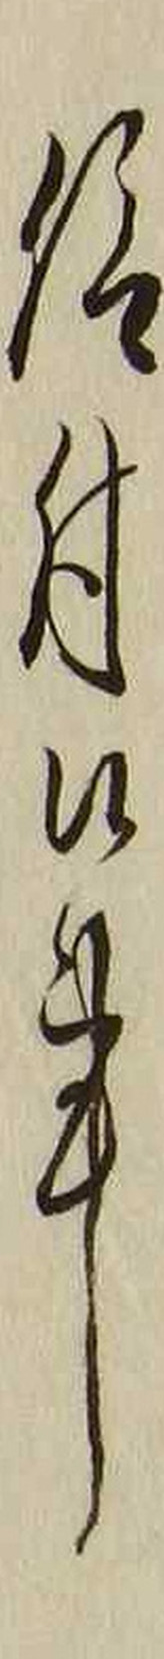仰付候事
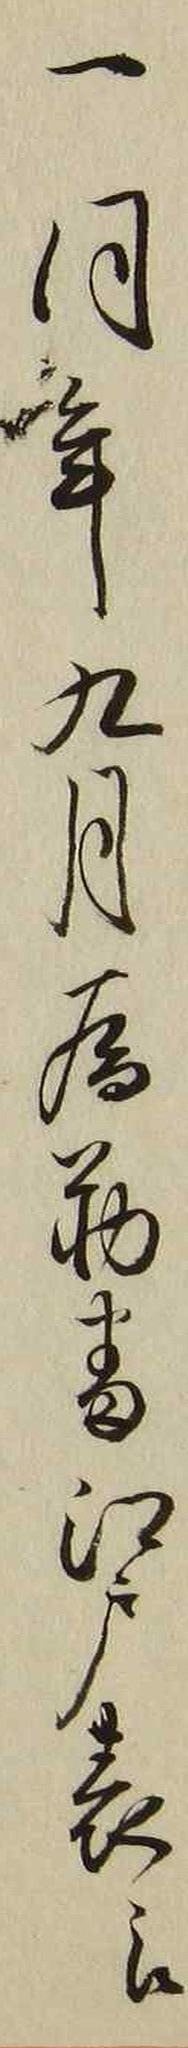一同年九月為勤番江戸表江
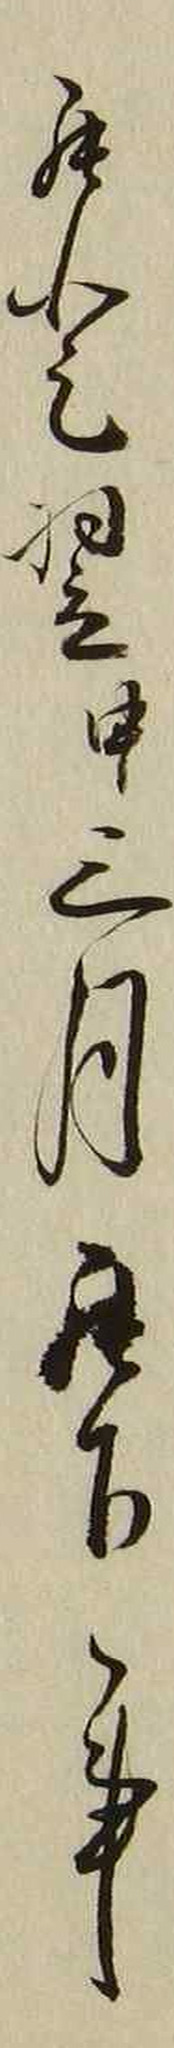罷登翌申三月罷下候事
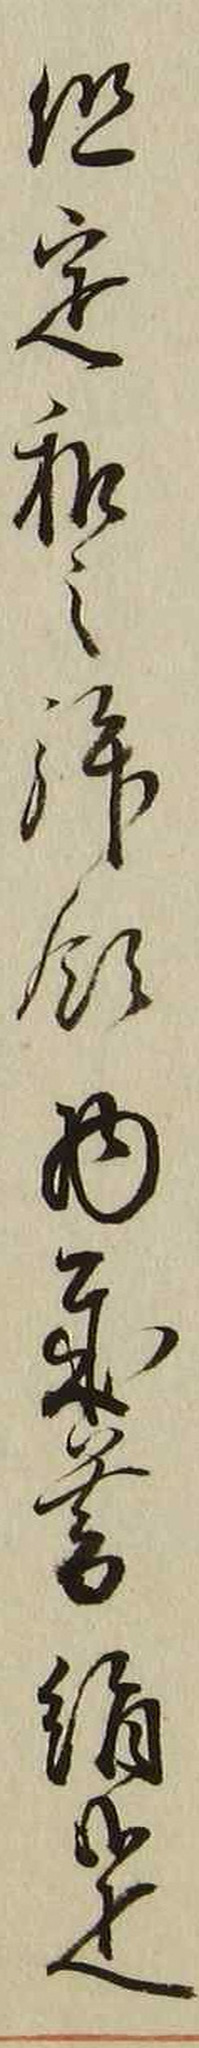但定和之拝領物歳暮絹弐疋
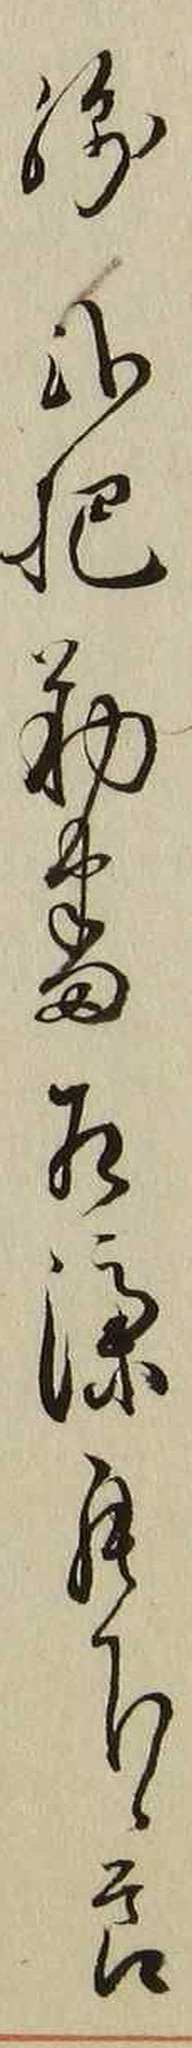綿弐肥勤番相済罷下候節
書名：諸士系譜　巻之1　い之部1
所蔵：会津若松市立会津図書館
